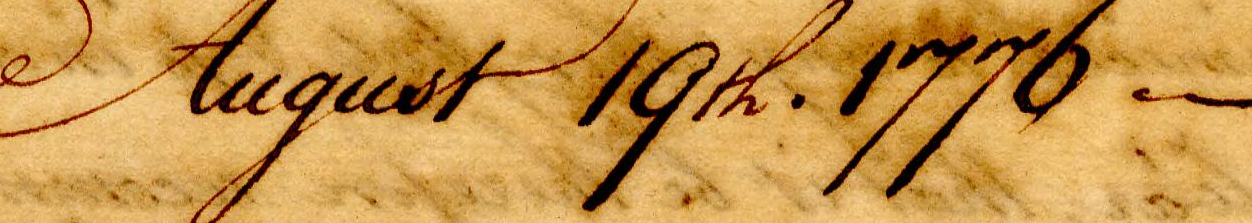August 19^th. 1776-
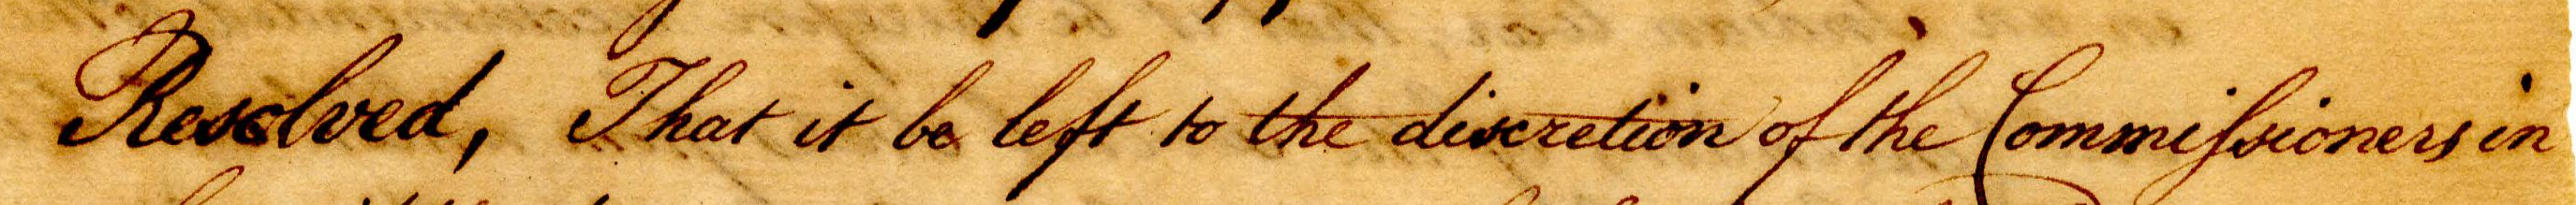Resolved, That it be left to the discretion of the Commissioners in
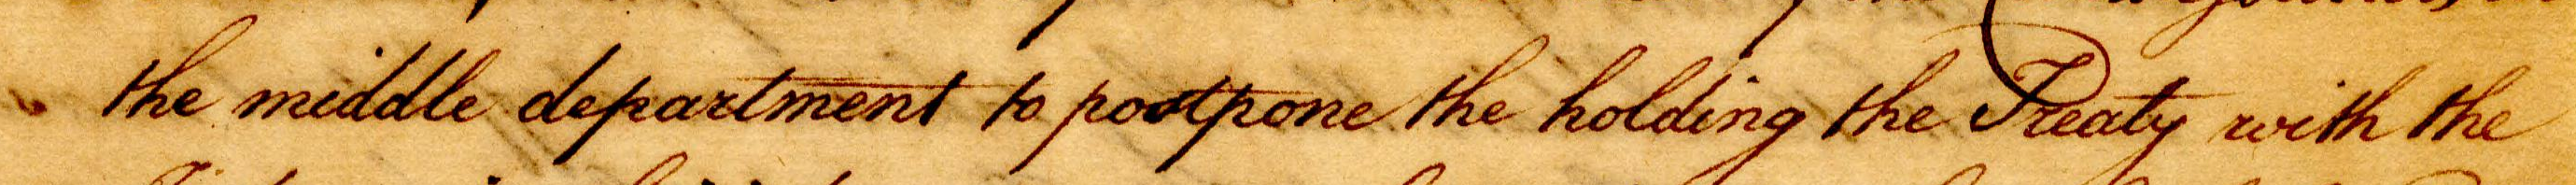the middle department to postpone the holding the Treaty with the
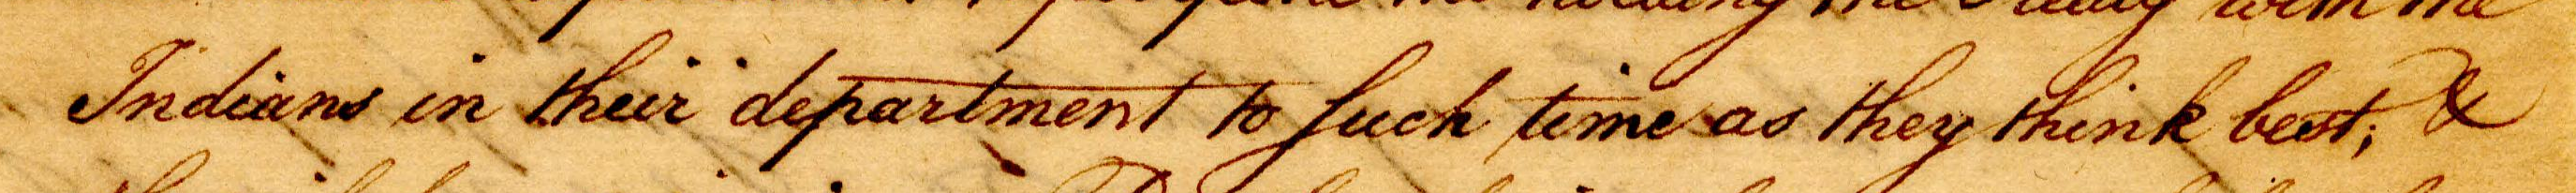Indians in their department to such time as they think best; &
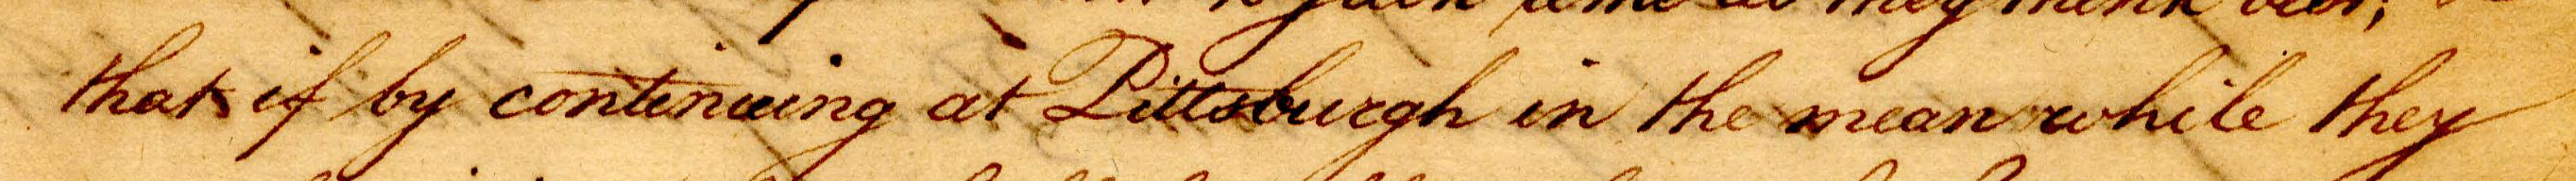that if by continuing at Pittsburgh in the meanwhile they
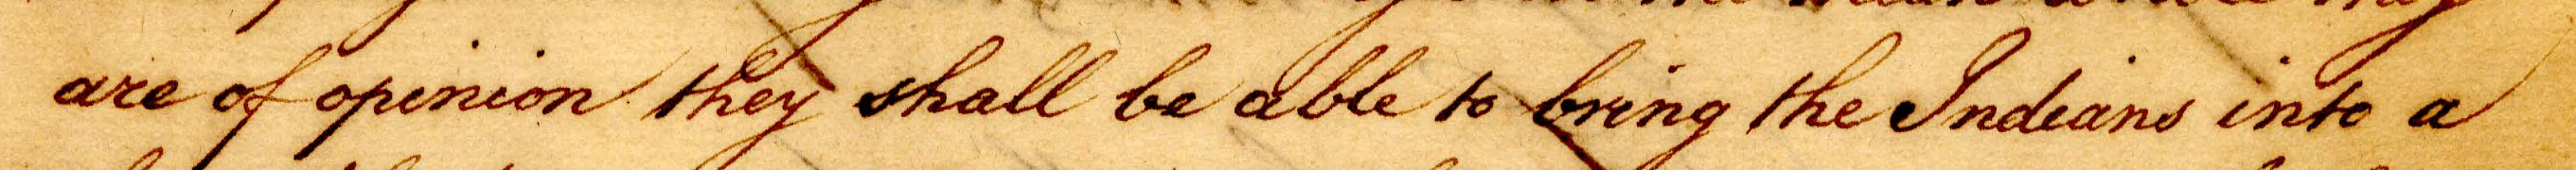are of opinion they shall be able to bring the Indians into a
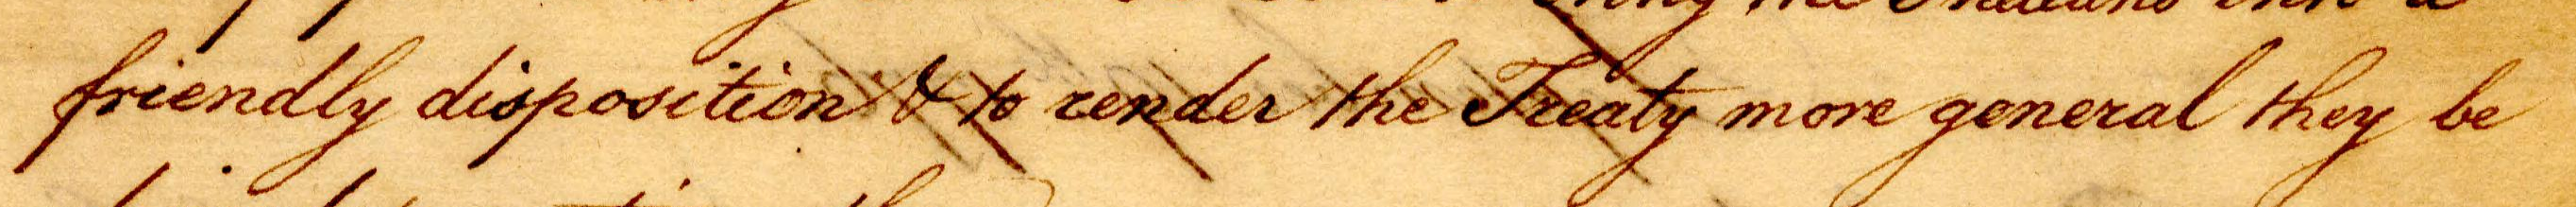friendly disposition & to render the Treaty more general they be
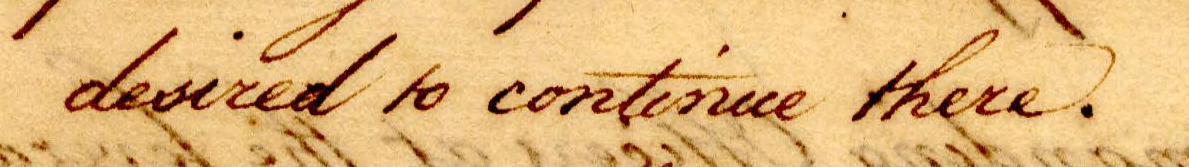desired to continue there.
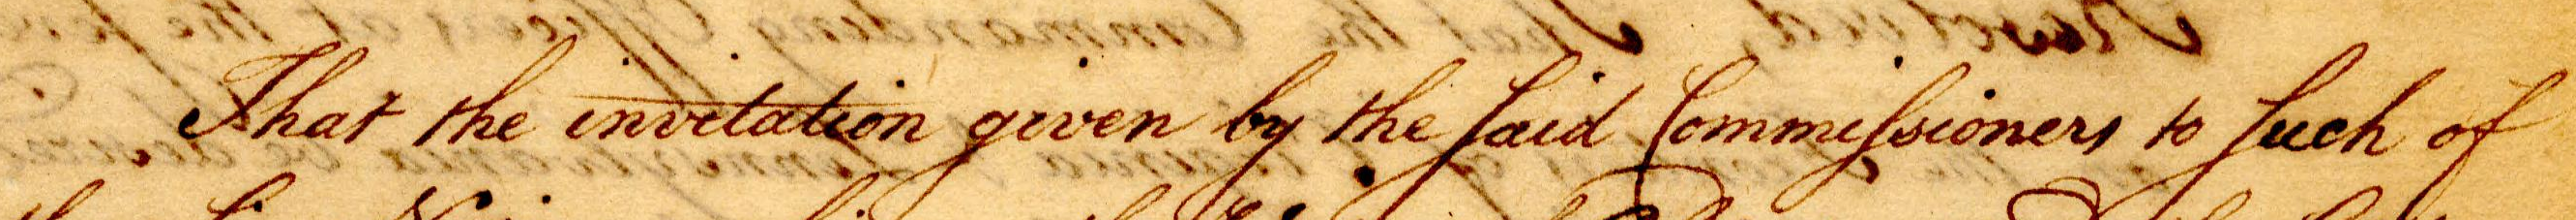That the invitation given by the said Commissioners to such of
